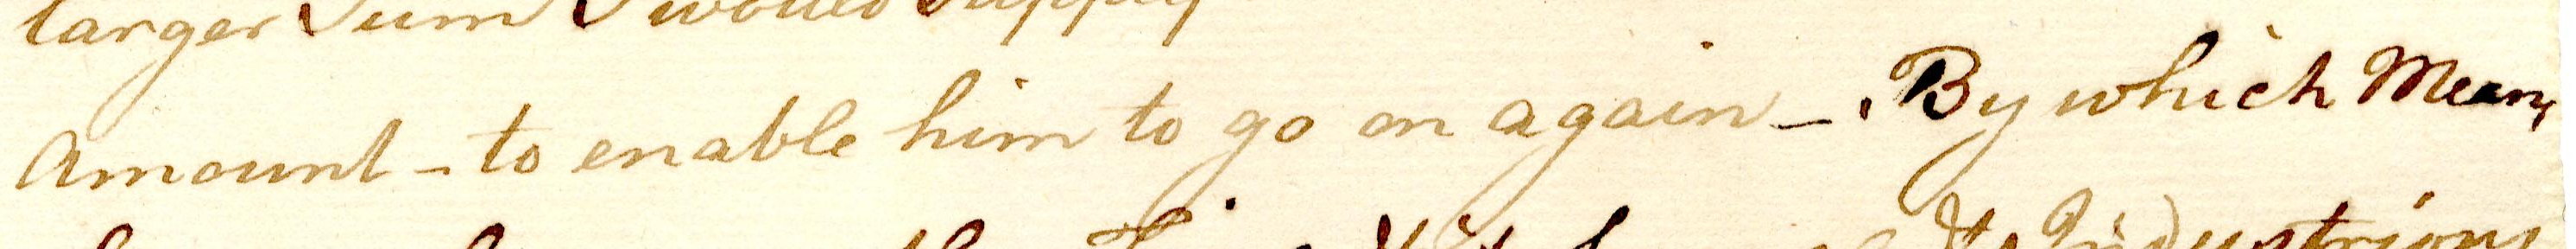Amount, to enable him to go on again. By which Means
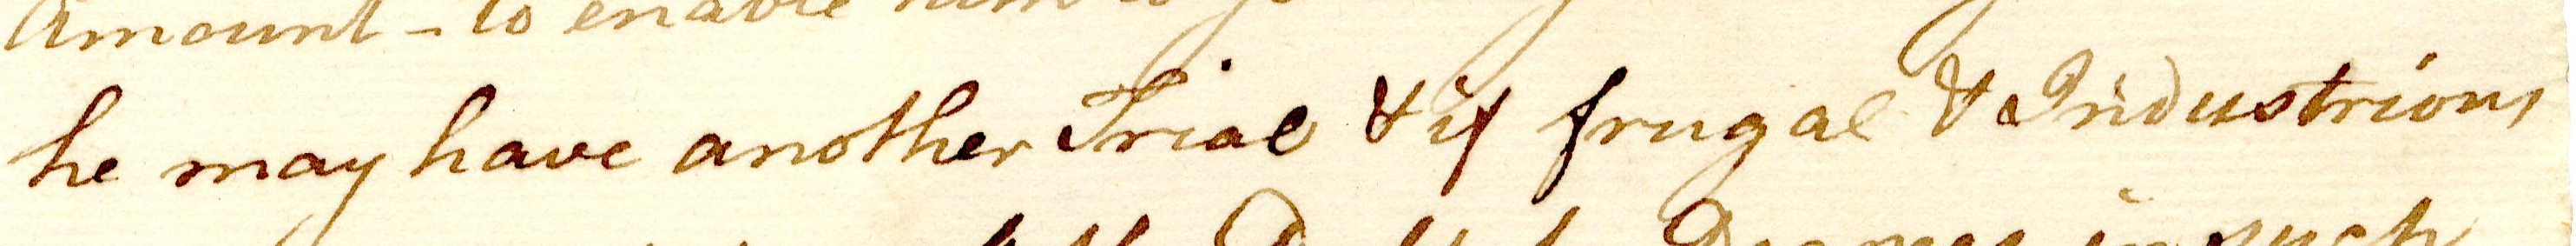he may have another Trial & if frugal & Industrious
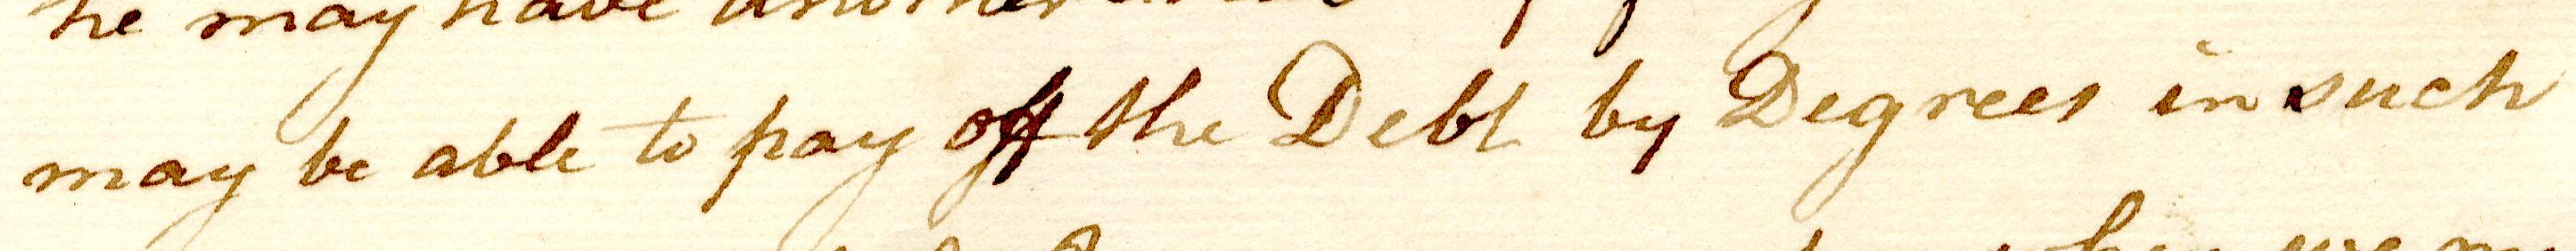may be able to pay off the Debt by Degrees in such
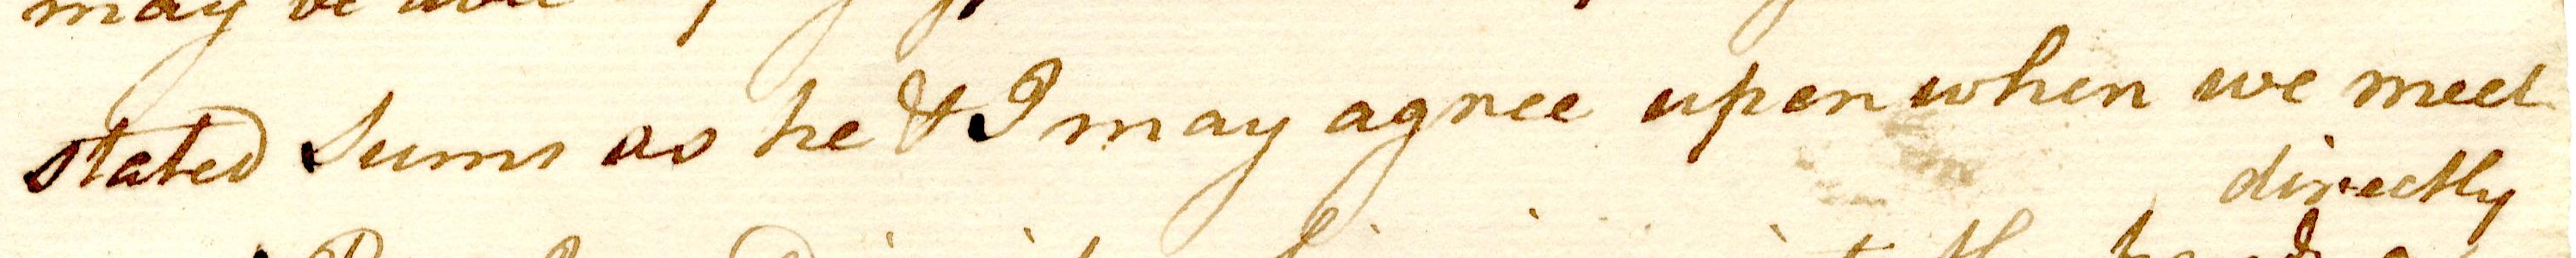stated sums as he & I may agree upon when we meet
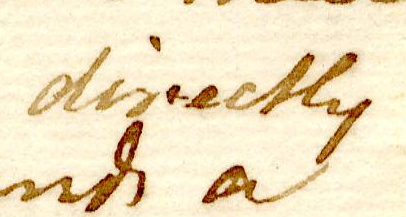directly
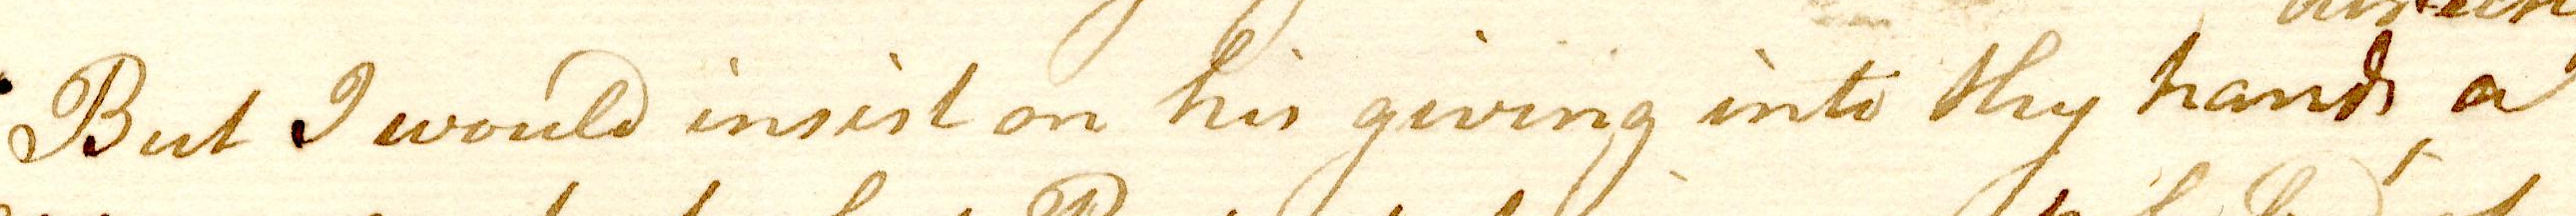But I would insist on his giving into thy hands ^ a
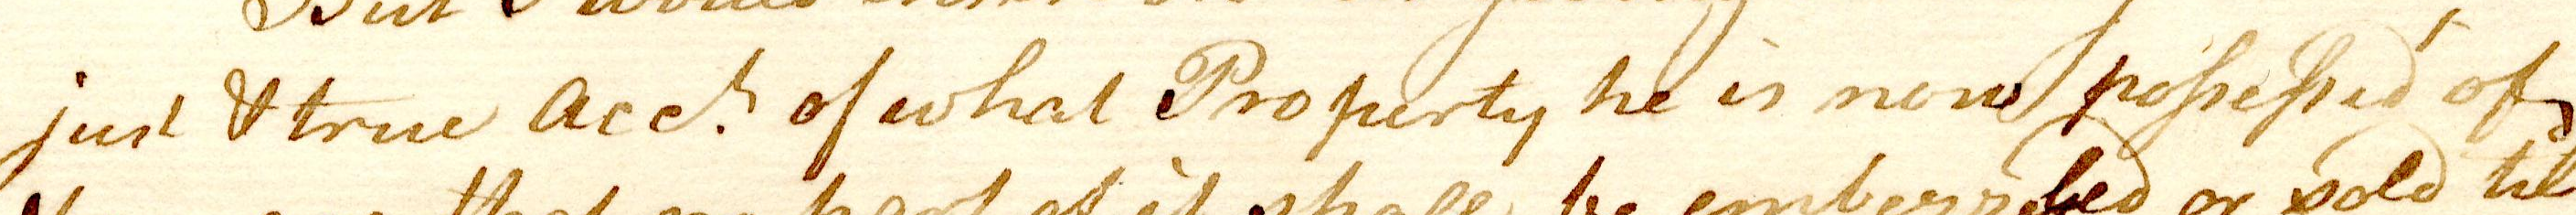just & true Acc^t. of what Property he is now possessed of
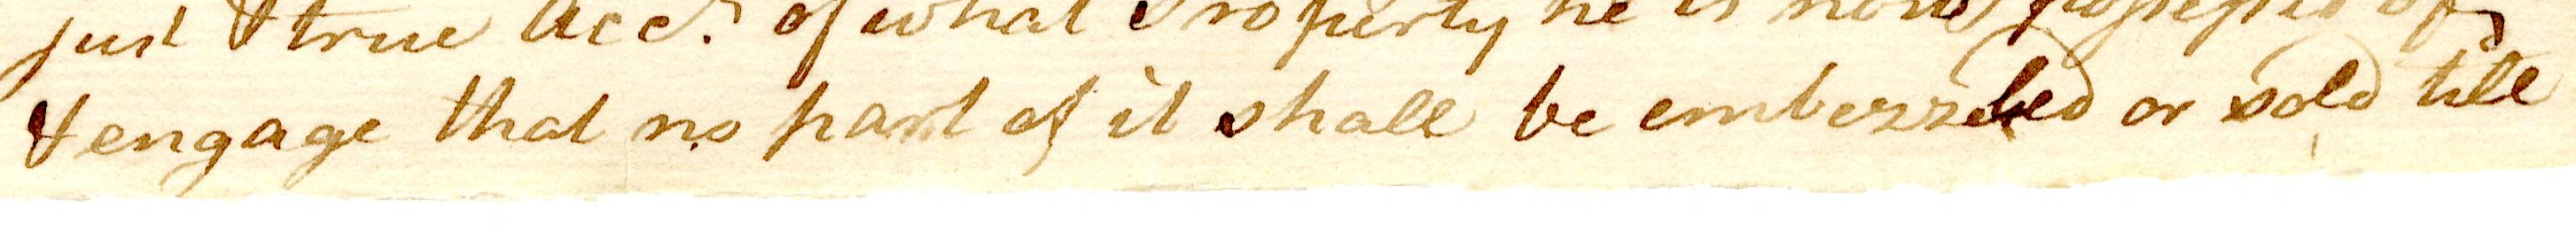& engage that no part of it shall be emberreled or sold till
